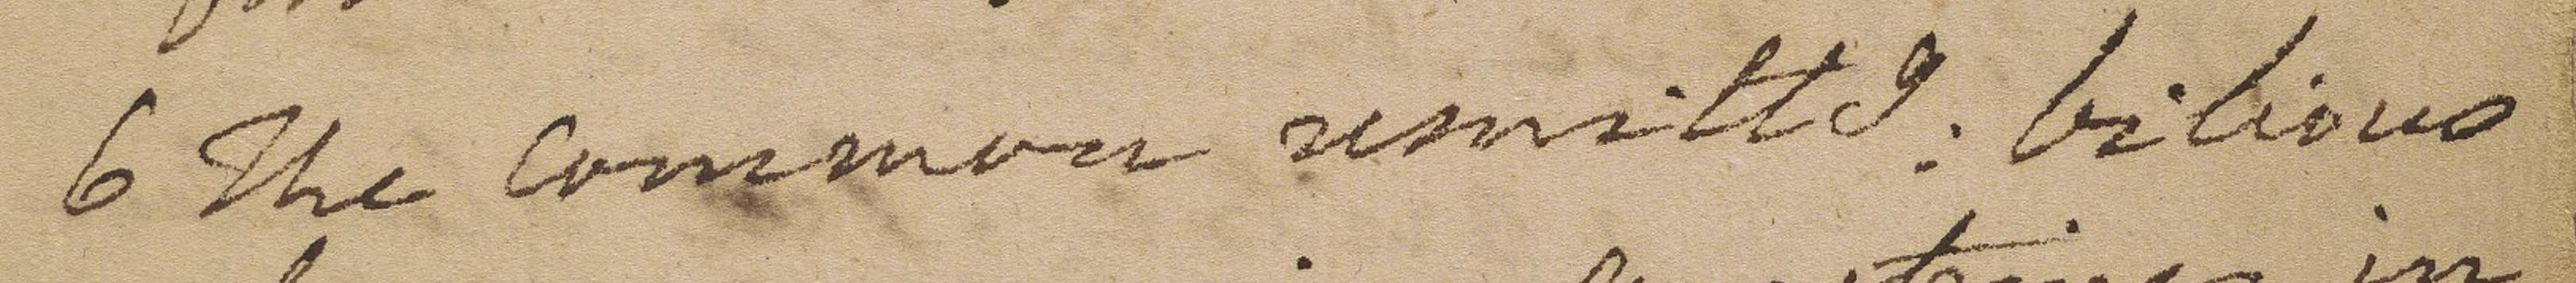6 The common remitt^g bilious
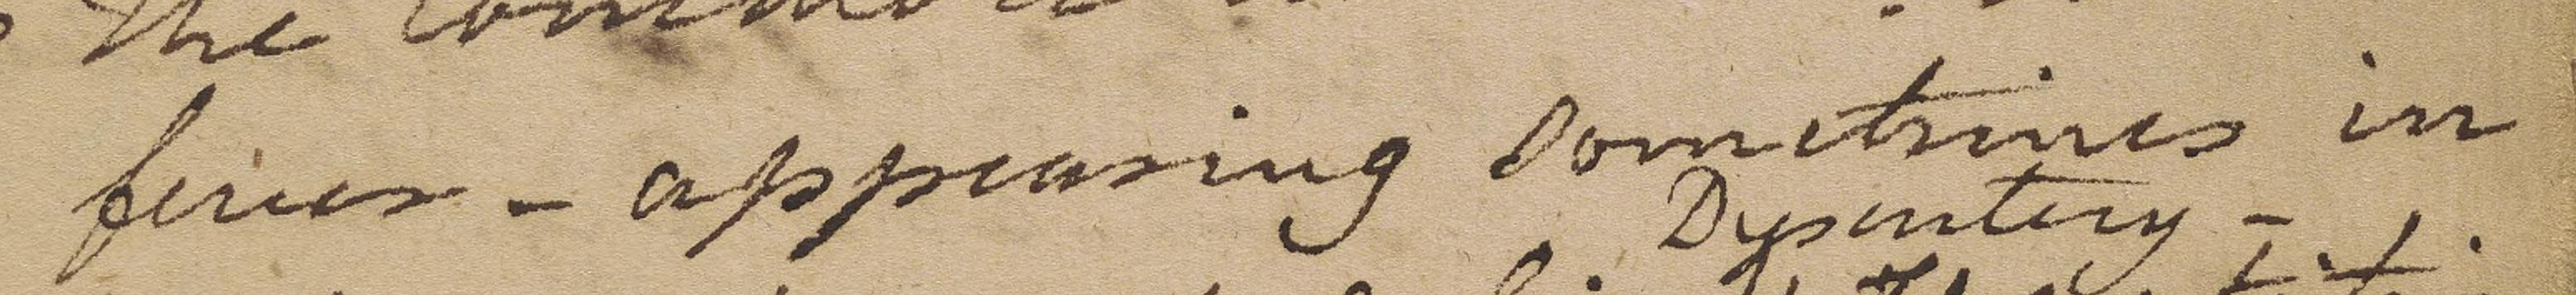fever, appearing sometimes in
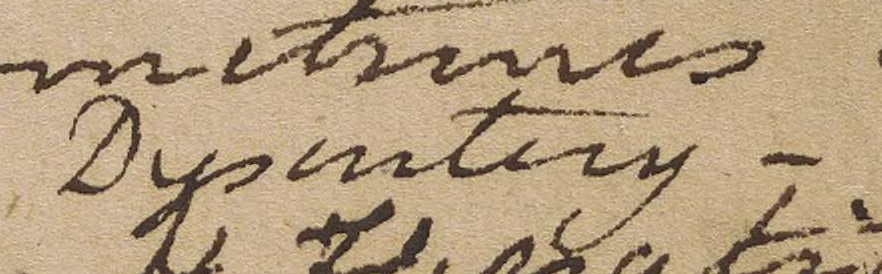Dysentery,
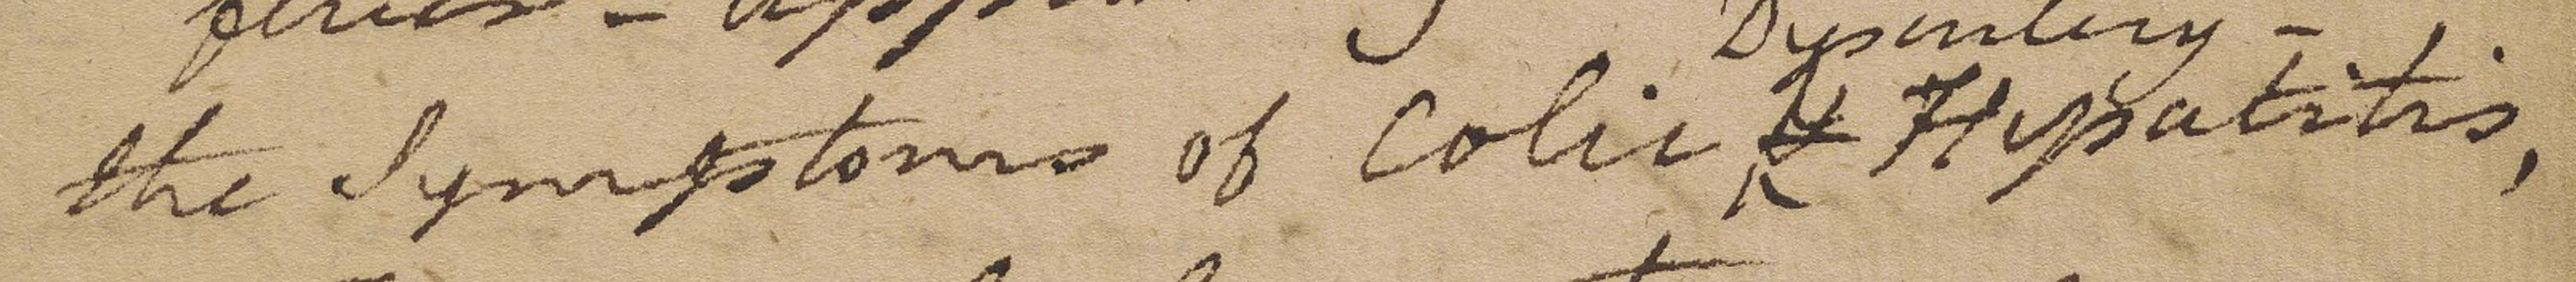the Symptoms of Colic ^ & Hypatitis
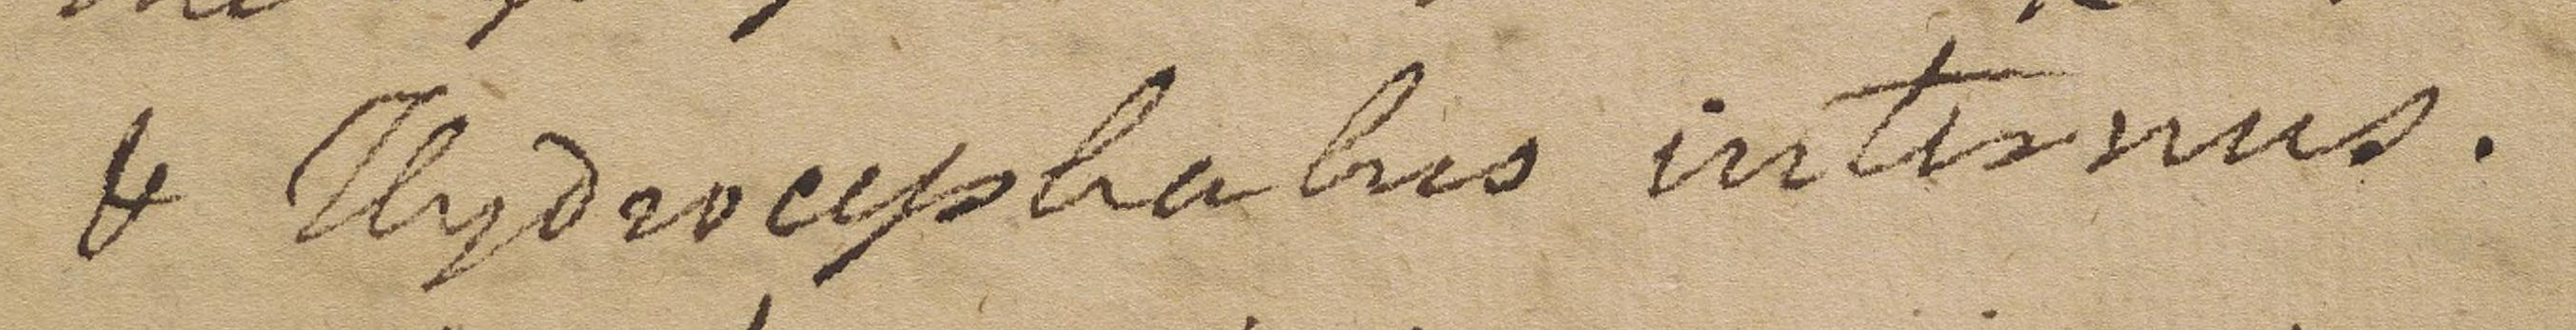& Hydrocephalus interrus.
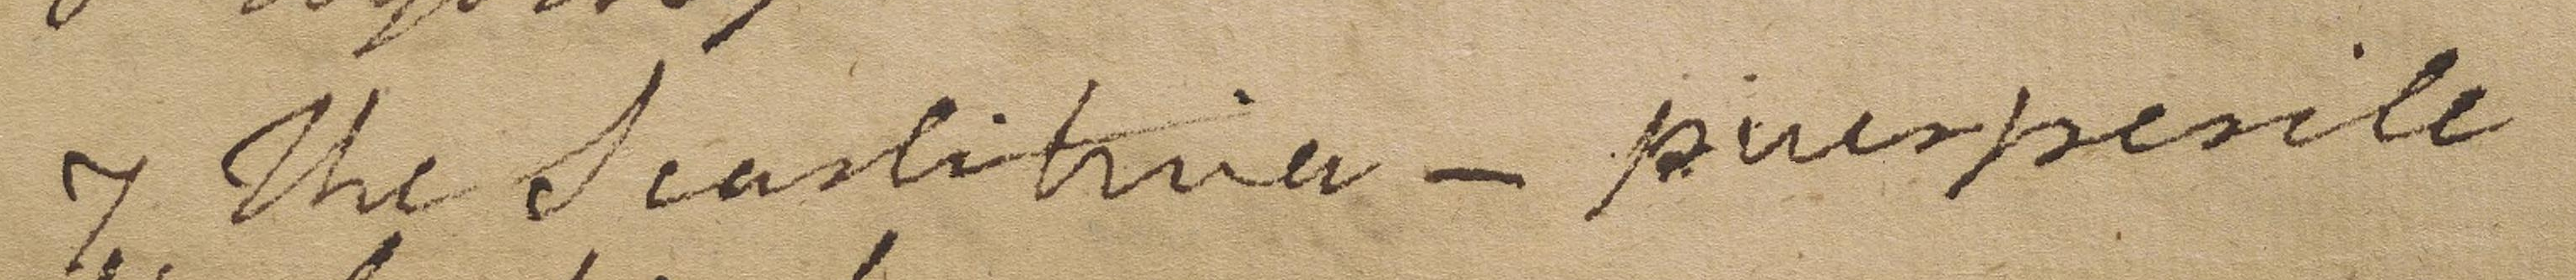7 The Scarlitina, puerperile
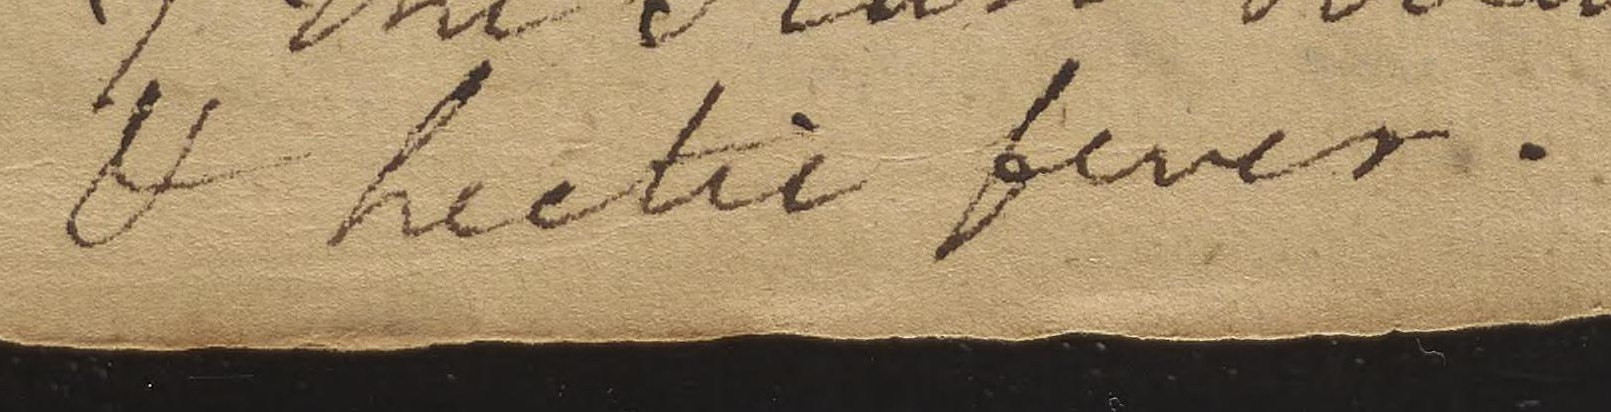& hectic fever.
